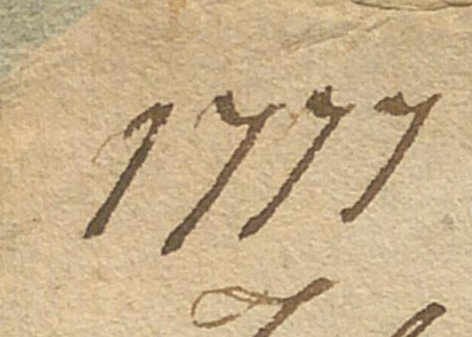1777
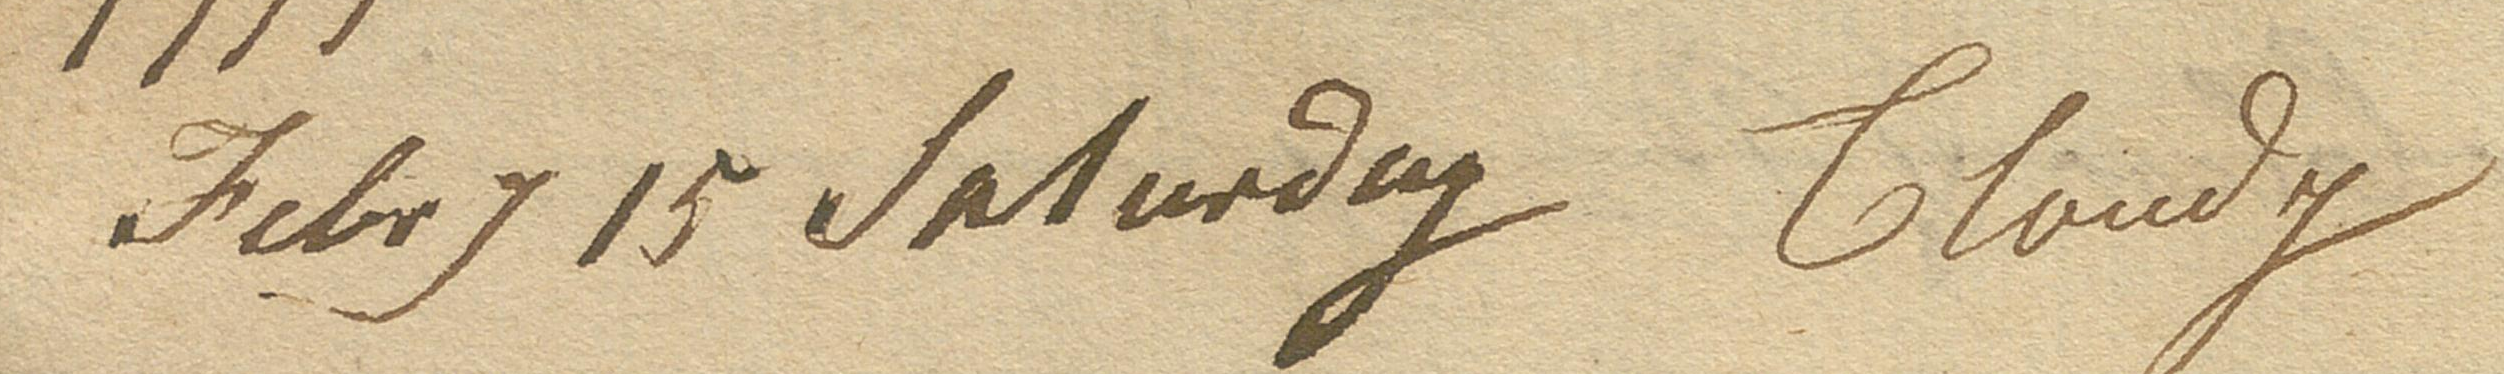Febry 15 Saturday Cloudy
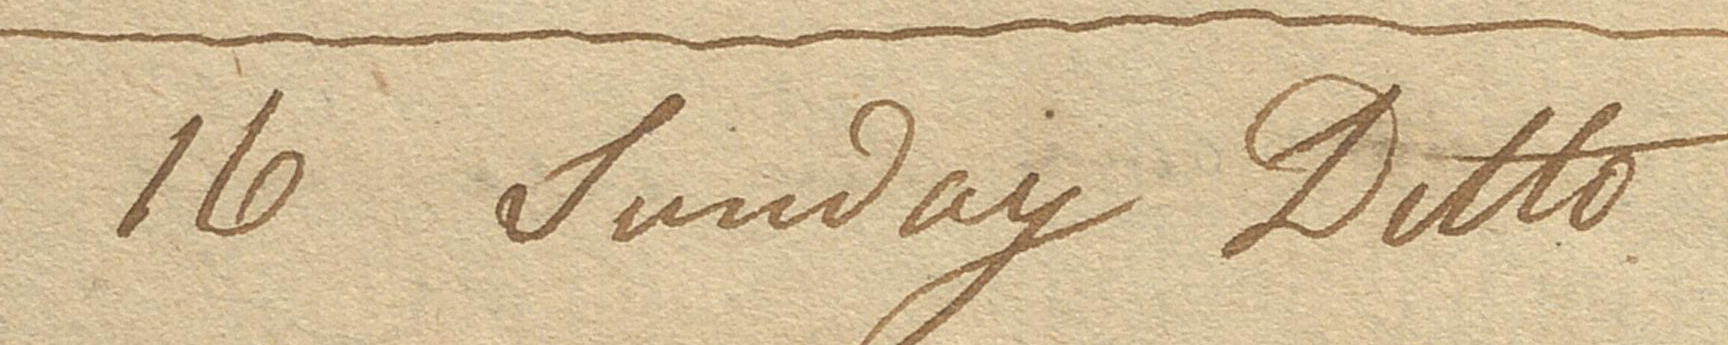16 Sunday Ditto
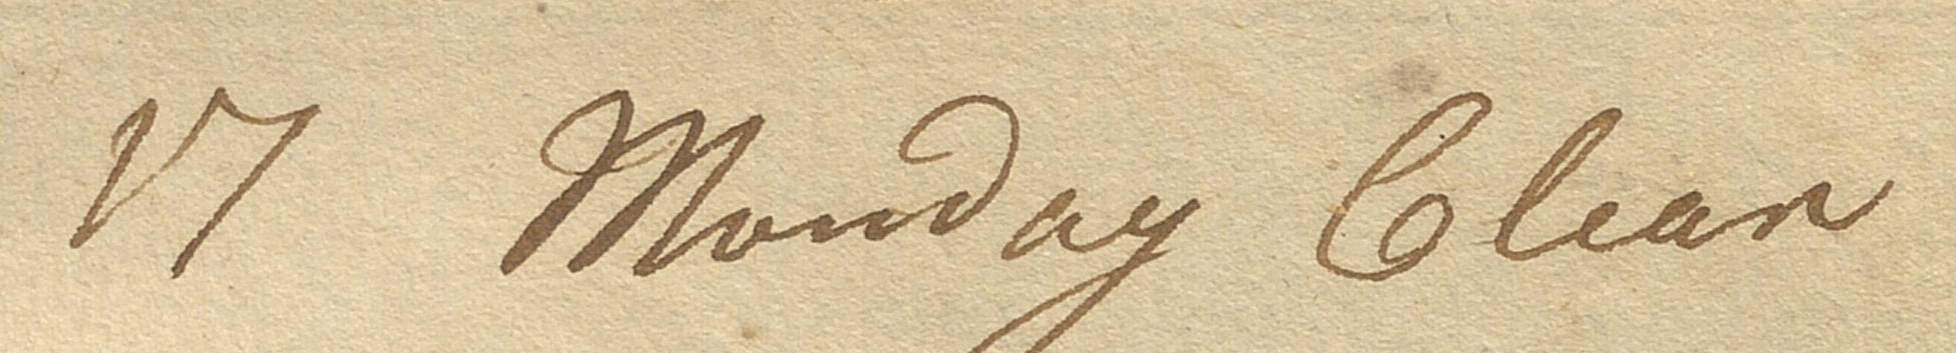17 Monday Clear
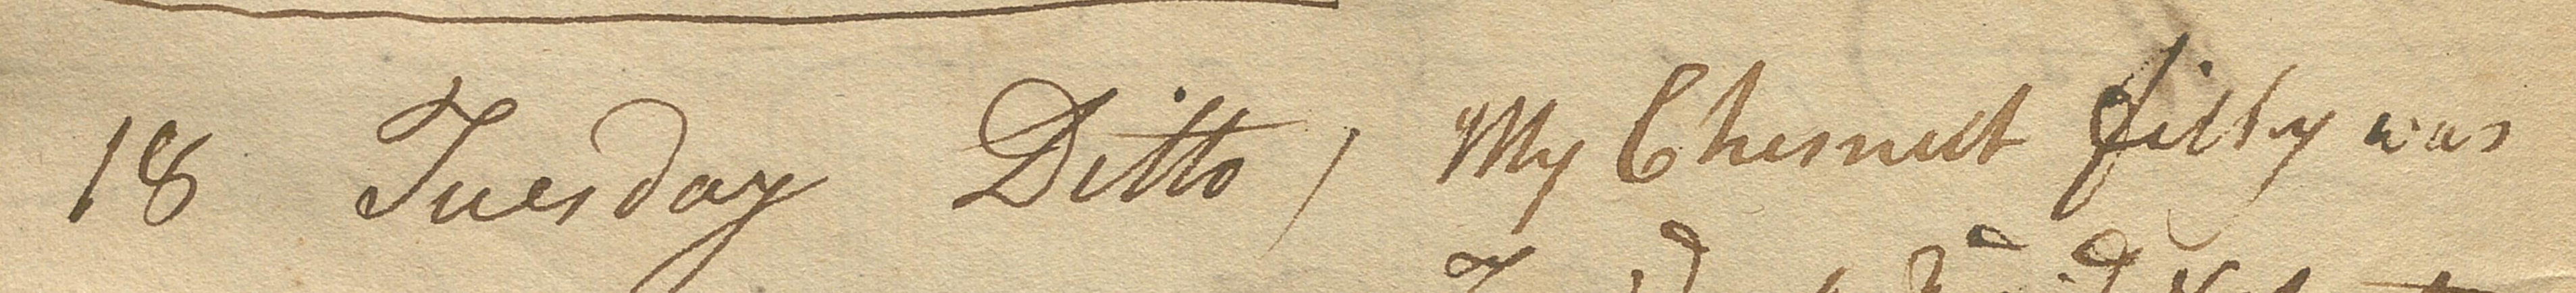18 Tuesday Ditto My Chesnet filly was
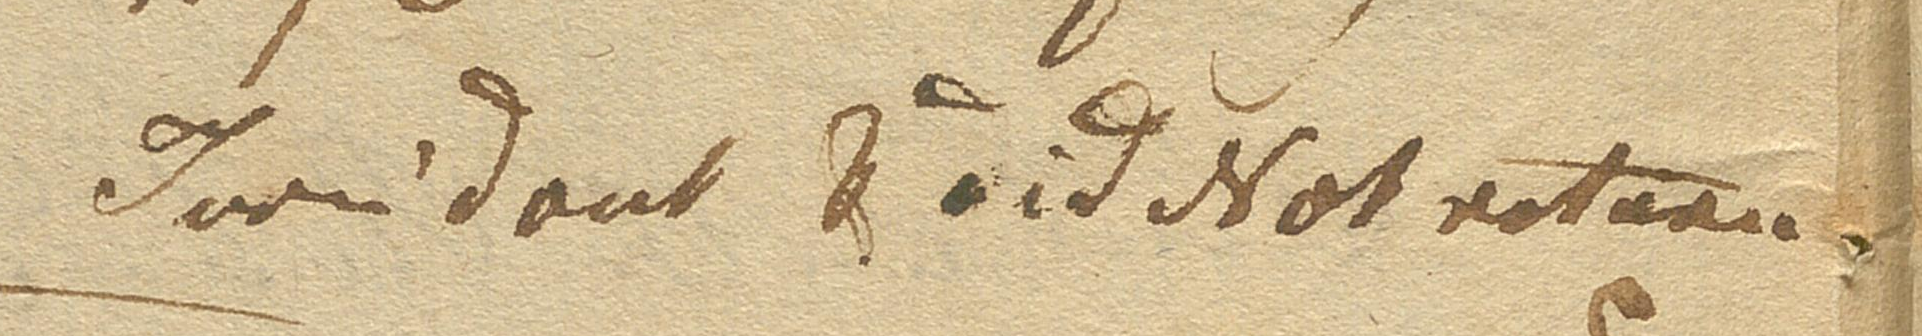Turn'd out & did Not return
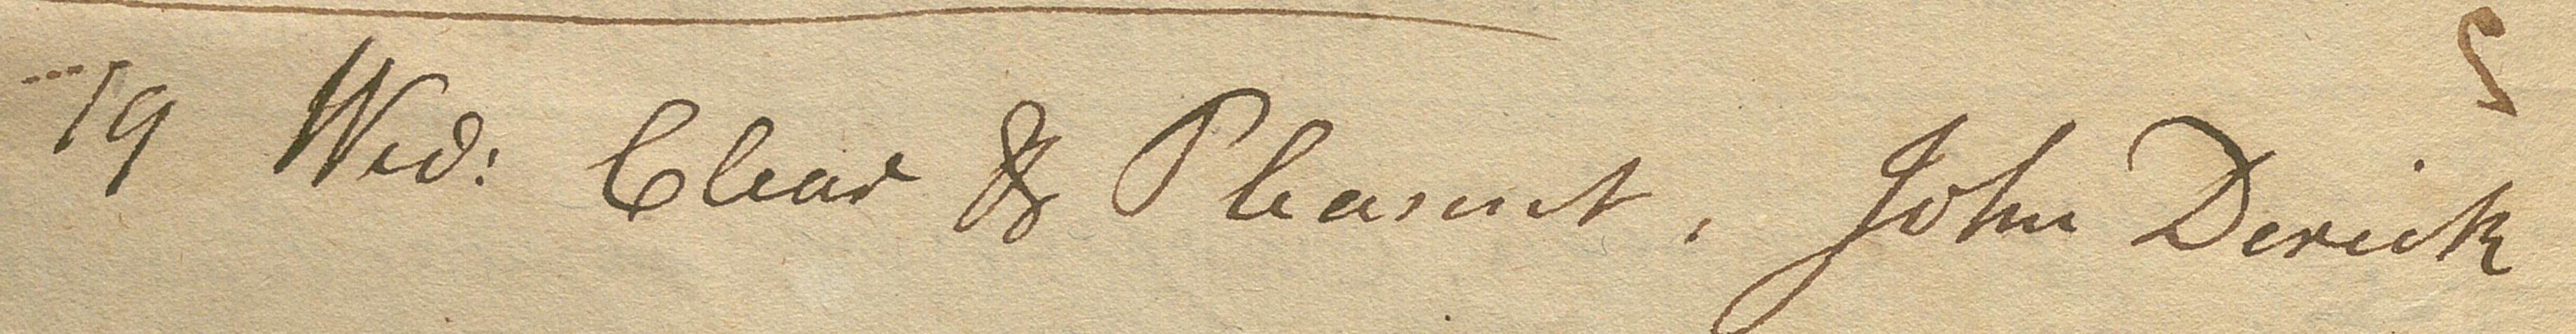19 Wed: Clear & Pleasent. John Derick
